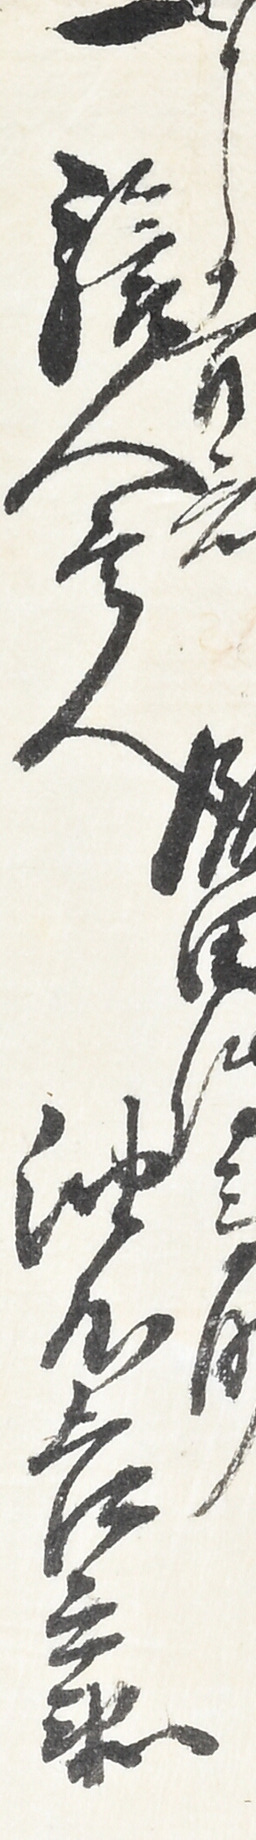一旅人壱人油屋吉兵衛
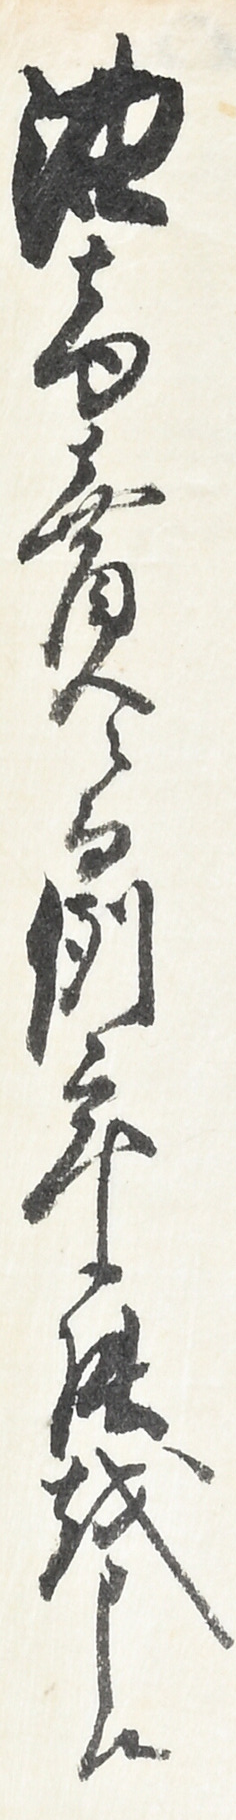油商売ニ而例年罷越申候
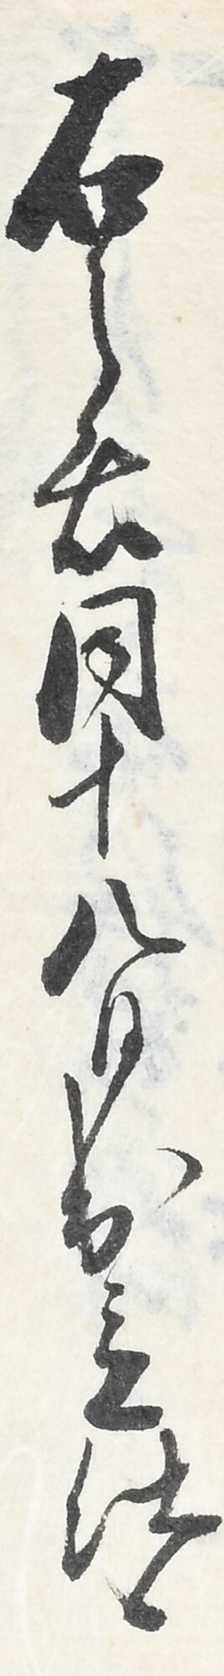右之者同廿日出立仕候

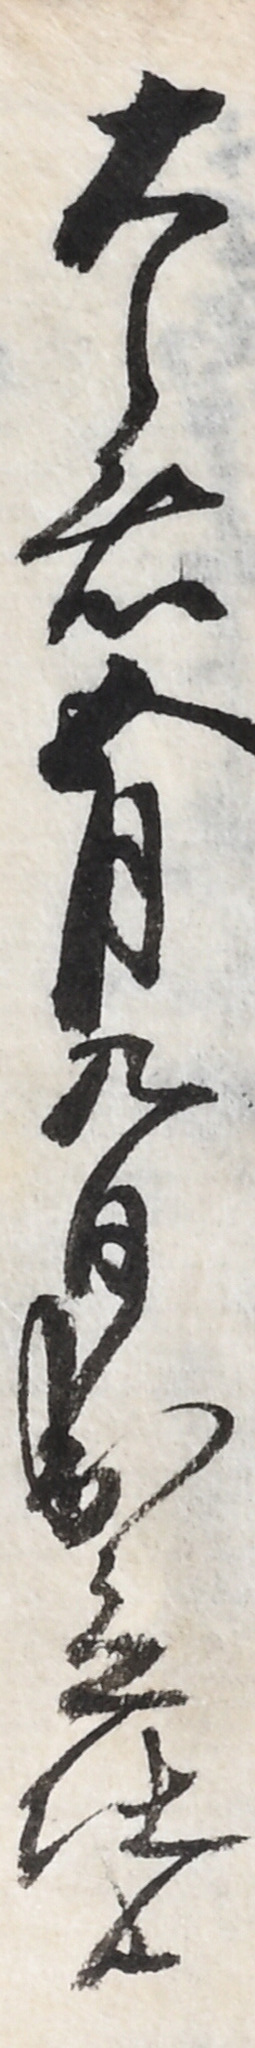右之者同十八日出立仕候
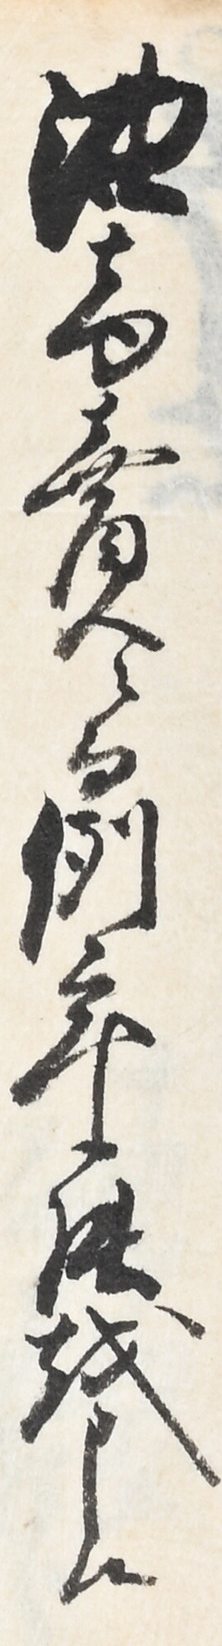唐津商売ニ而例年罷越申候
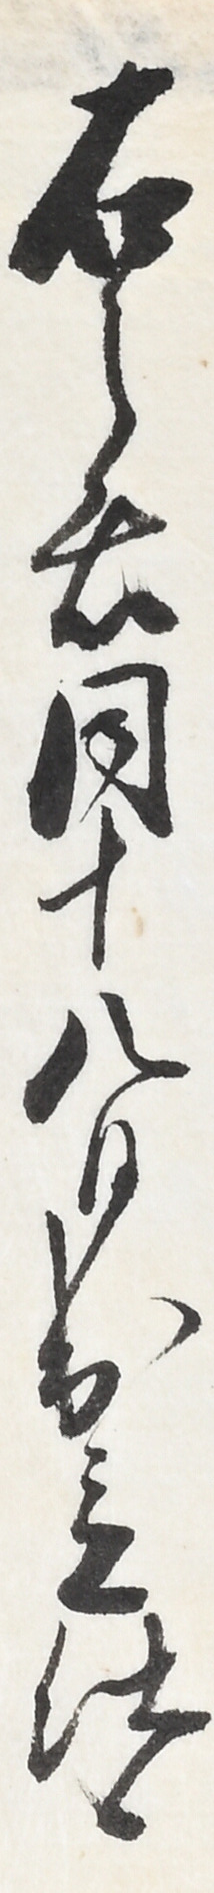右之者同十八日出立仕候
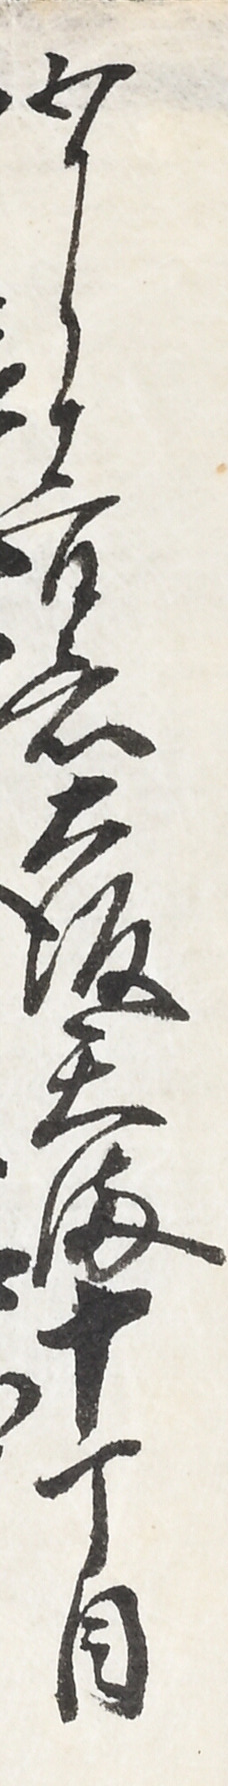五月十二日着大坂天満十丁目
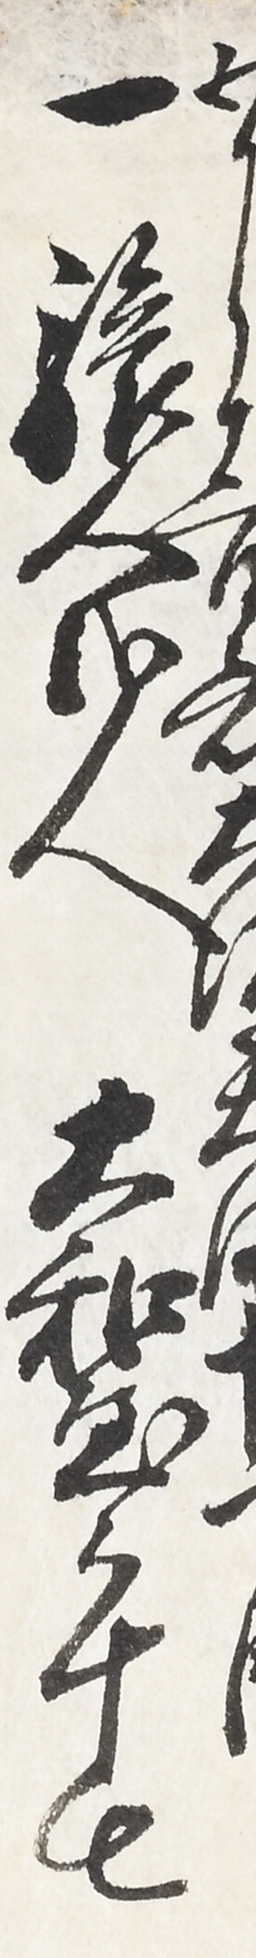一旅人弐人大和屋平七
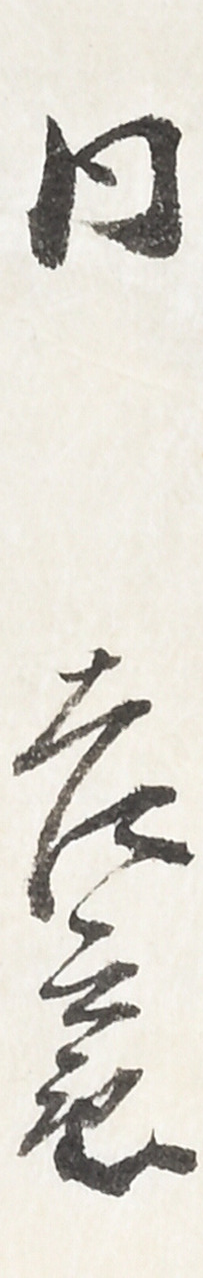同吉兵衛
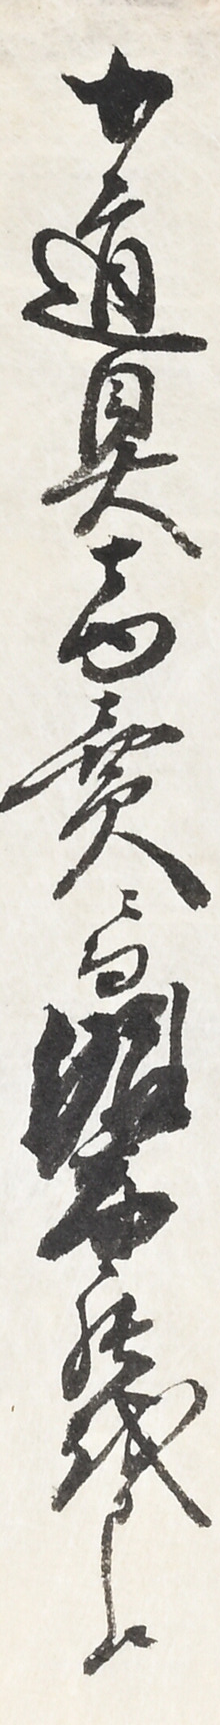小道具商売ニ而始而罷越申候
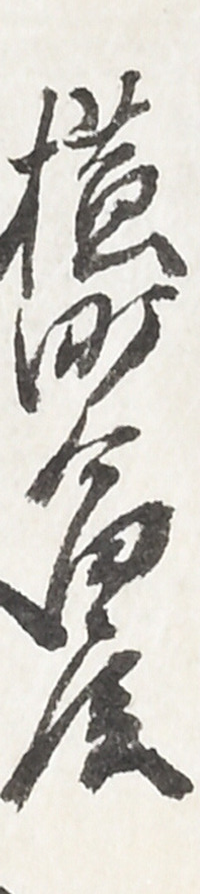横町富屋
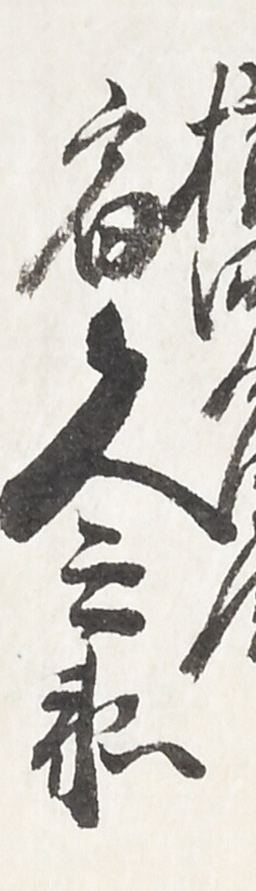宿久兵衛
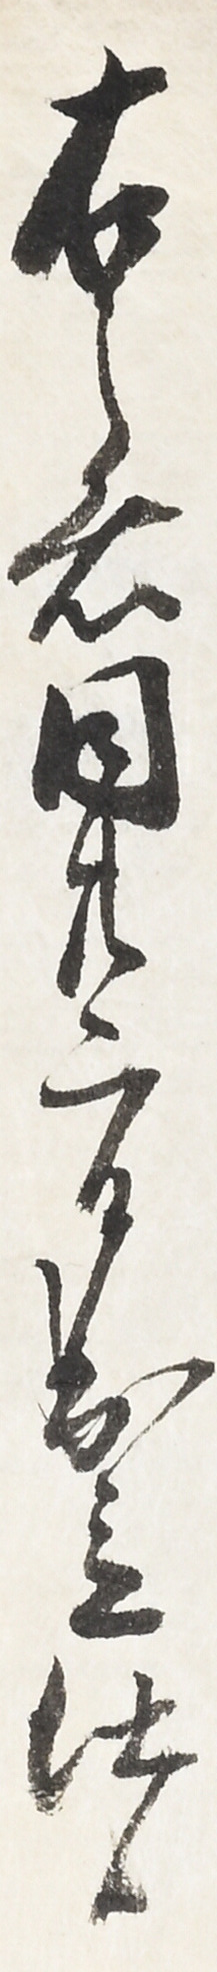右之者同廿二日出立仕候
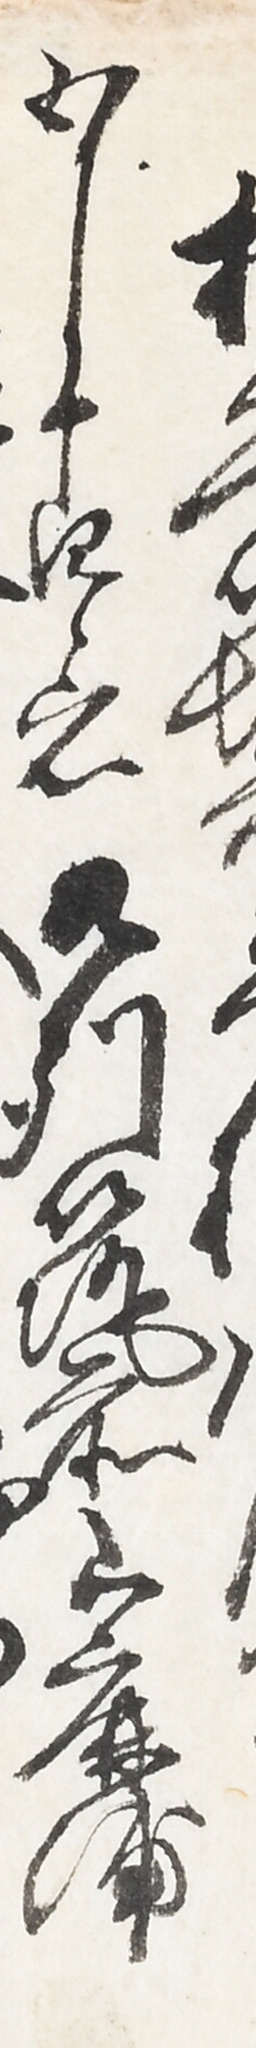五月十四日着九州筑前山鹿浦
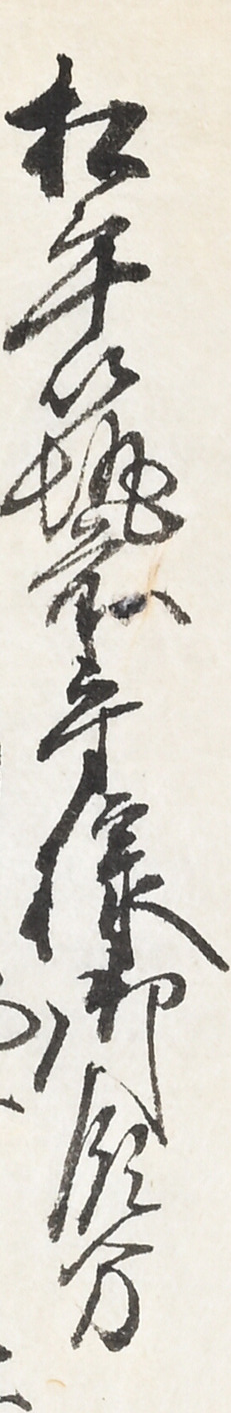松平筑前守様御領分
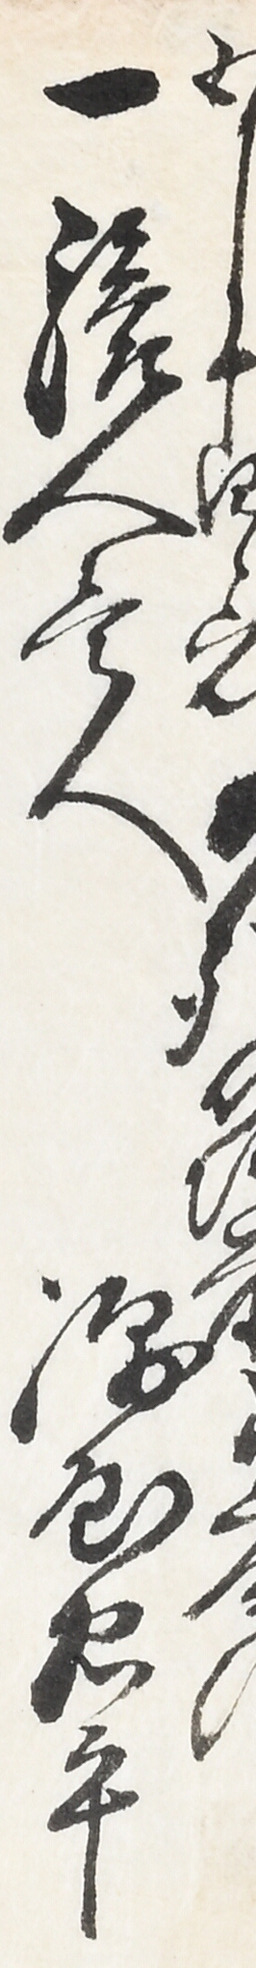一旅人壱人綿屋忠平
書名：旅人泊控帳
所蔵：伊那市立高遠町図書館・合同会社AMANE
